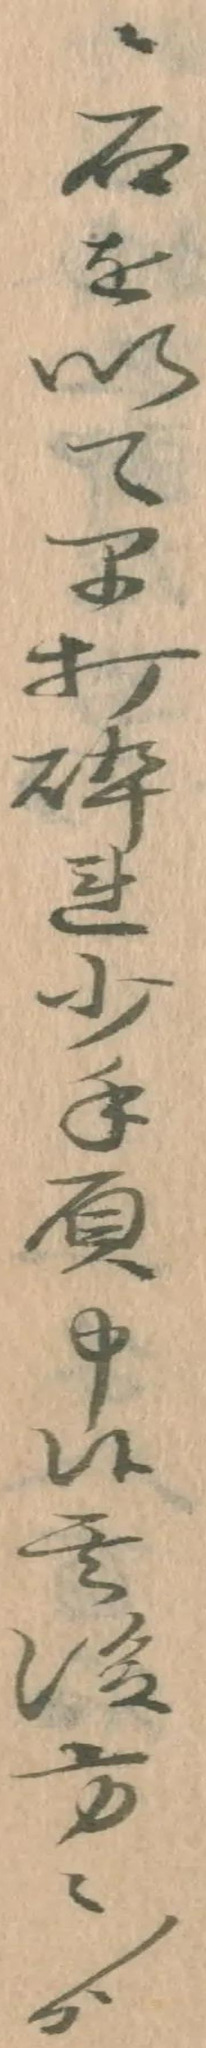に石を以て早打砕連少手負申候其後方々ゟ
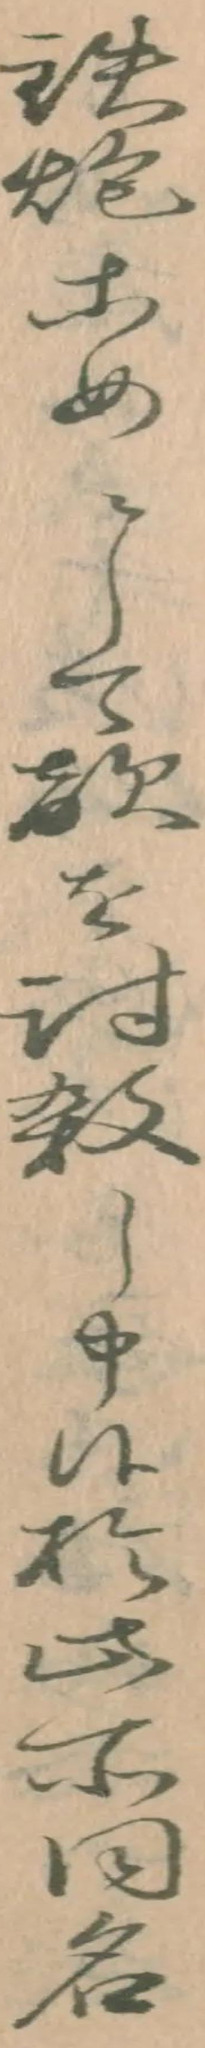鉄砲古めにして敵を討殺し申候於此所同名
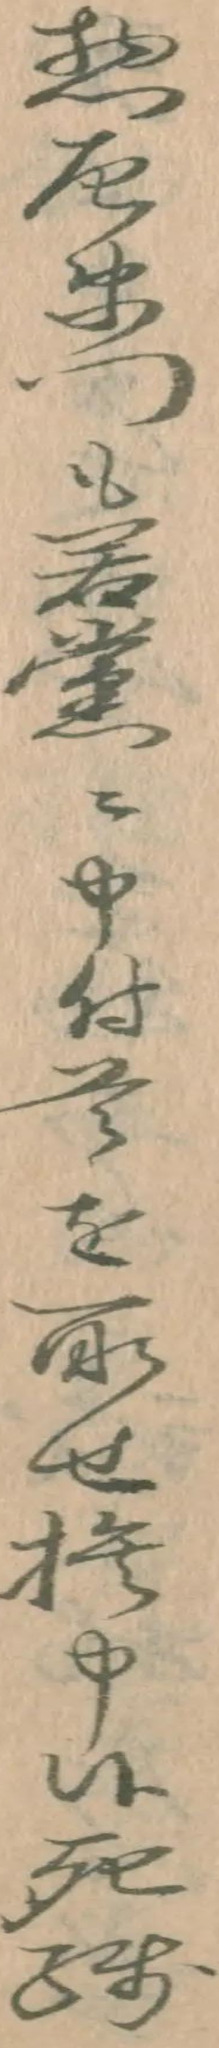惣左衛門も若党に申付首を取せ捨申候死残
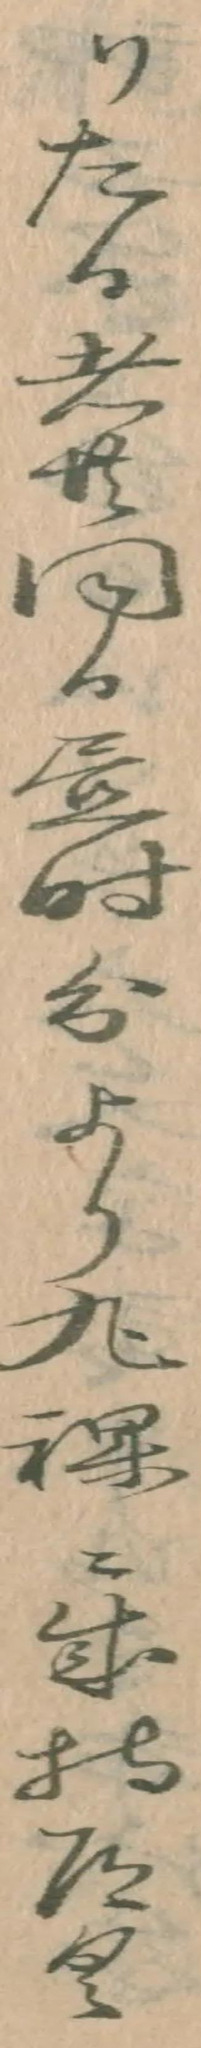りたる者共同日昼時分より丸裸に成持道具
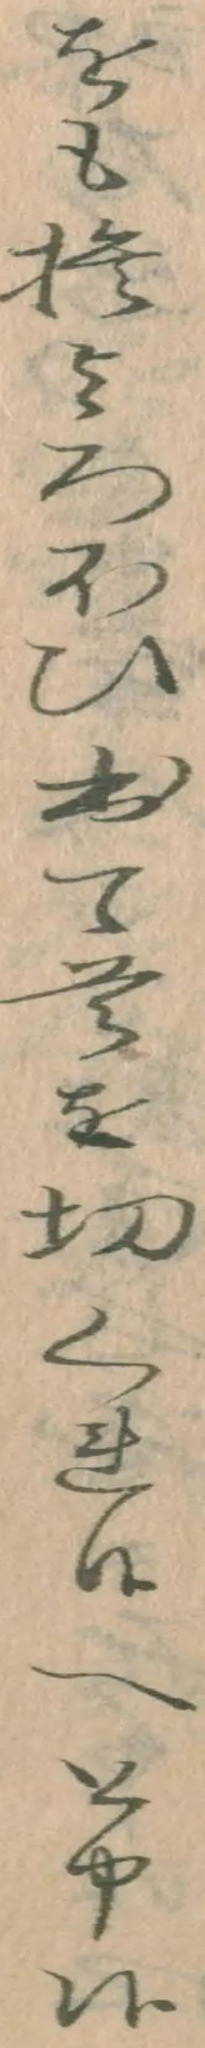をも捨与ろ不ひ出て首を切く連候へと申候
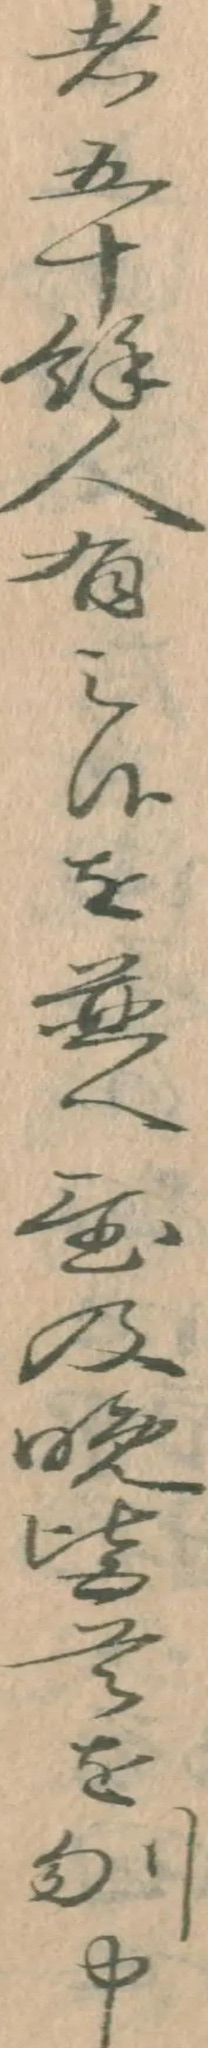者五十余人有之候を並へ置及晩皆首を刎申
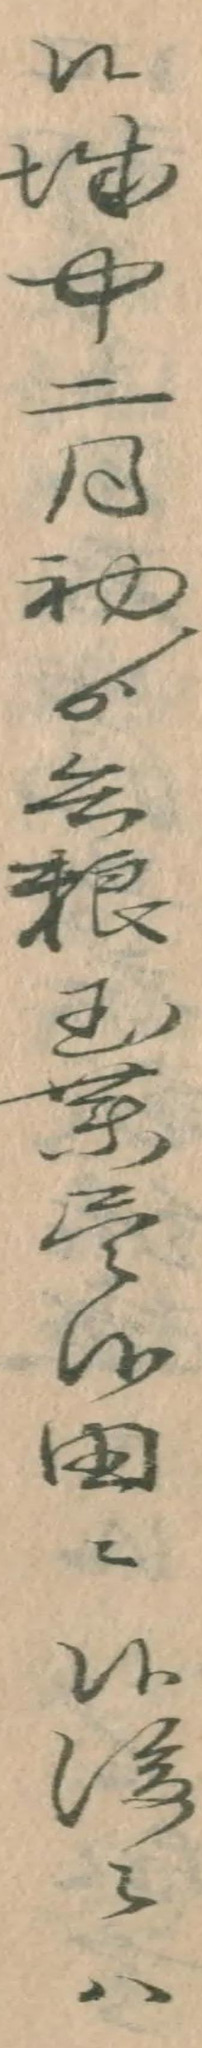候城中二月初ゟ兵粮玉薬尽候由に候後には
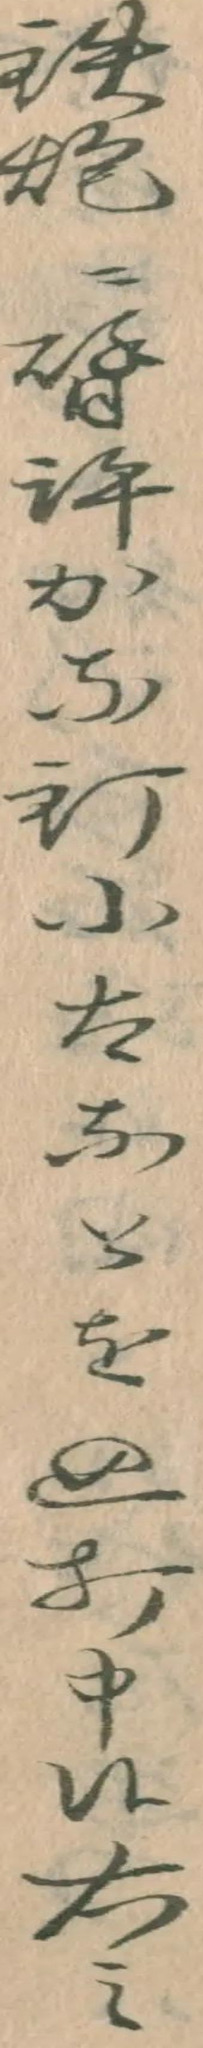鉄砲に臂許かな釘小太なとを込打申候右之
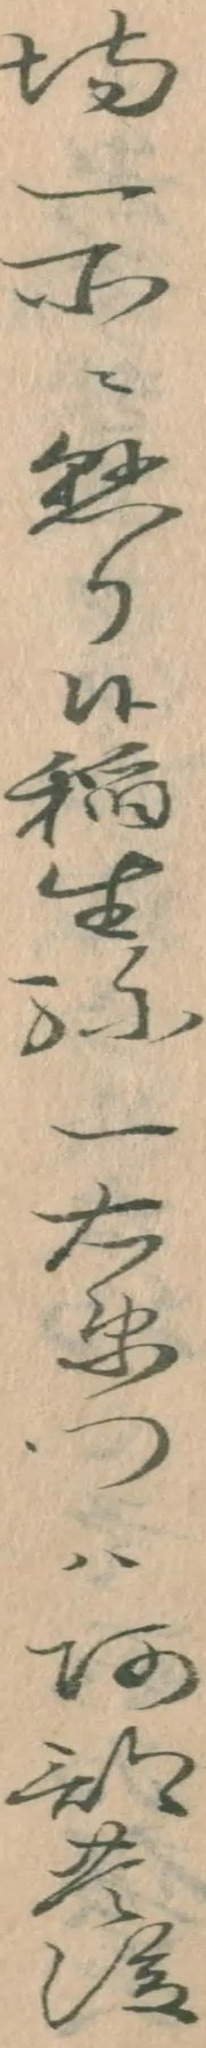場一所に懸り候稲生弥一右衛門は阿部豊後
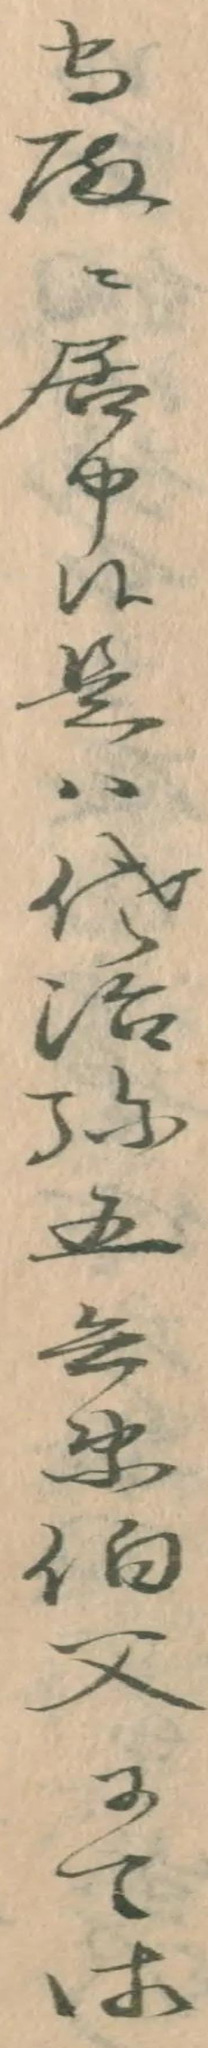神殿に居申候是は佐治弥五兵衛伯父尓て御
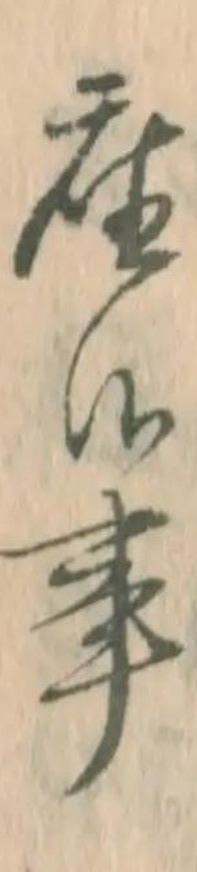座候事

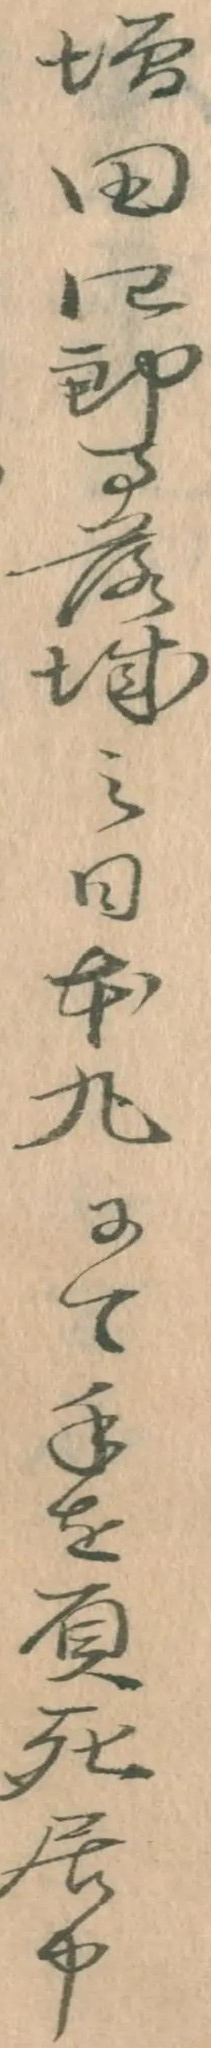増田四郎事落城之日本丸尓て手を負死居申
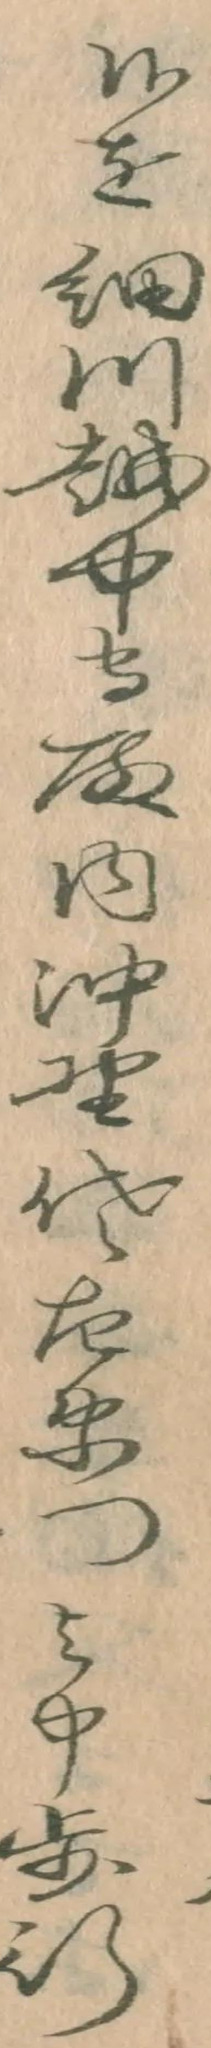候を細川越中守殿内沖野佐左衛門与申歩行
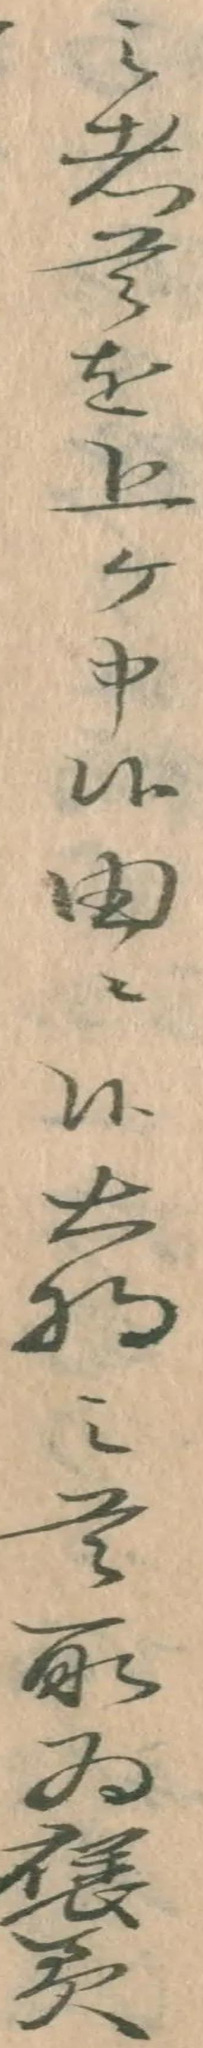之者首を上け申候由に候大将之首取ゐ褒美
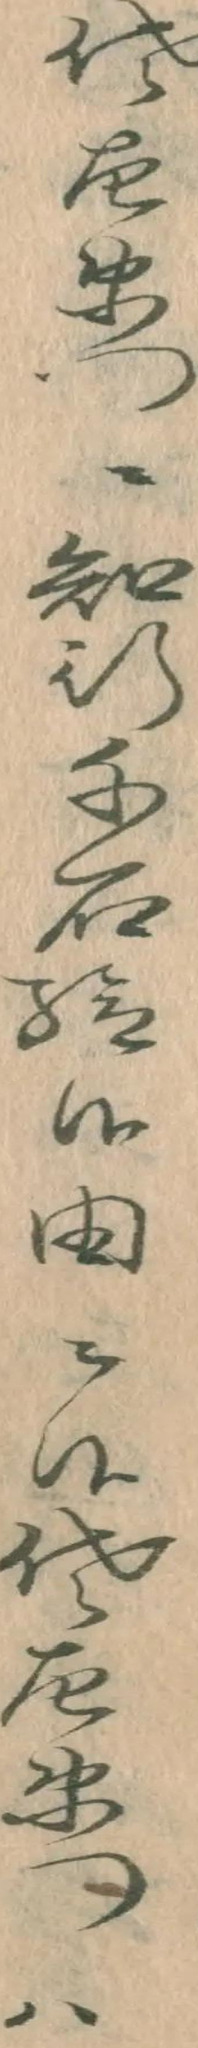佐左衛門に知行千石給候由に候佐左衛門は
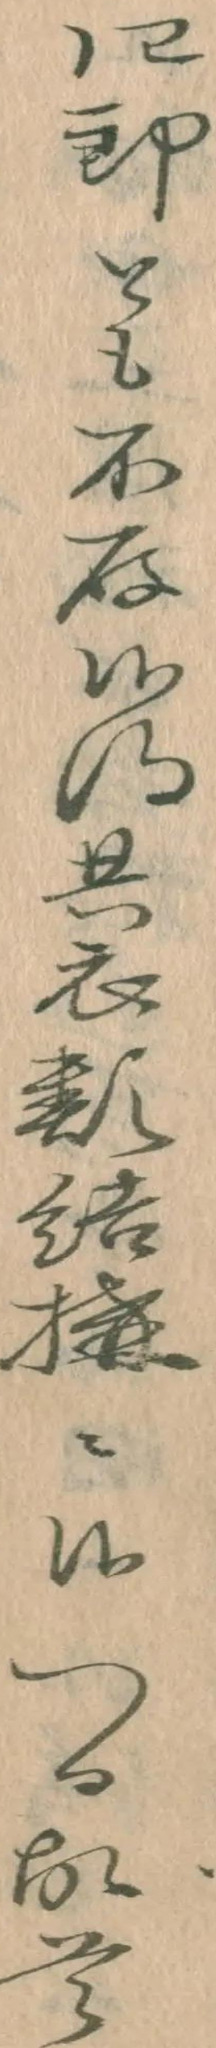四郎とも不存候得共衣類結構に候つる故首
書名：切支丹御退治記 49巻. [9]
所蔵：国立国会図書館 National Diet Library, JAPAN
